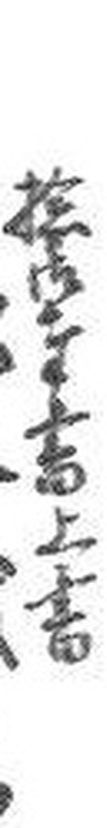捻御奉書上書
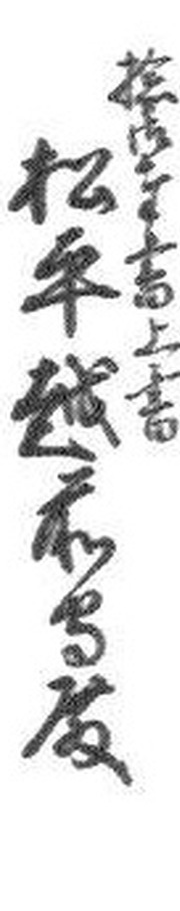松平越前守殿
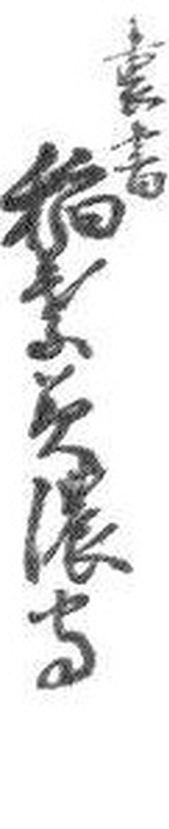稲葉美濃守
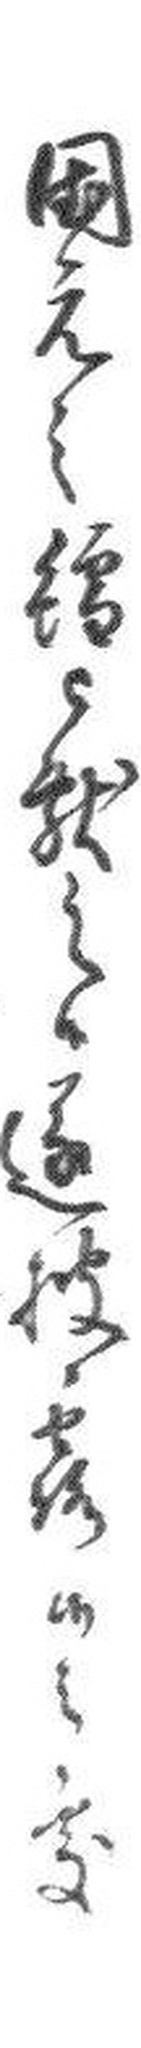国元之鱈被献之候遂披露候之処
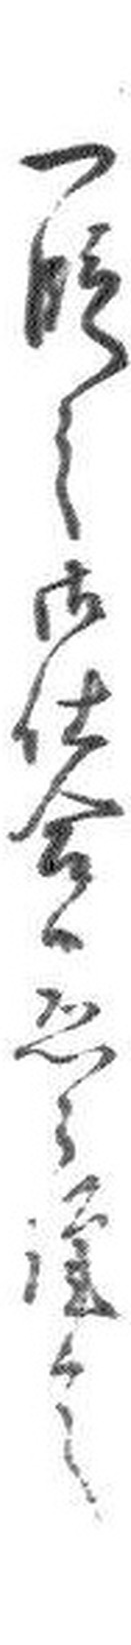一段之御仕合候恐々謹言
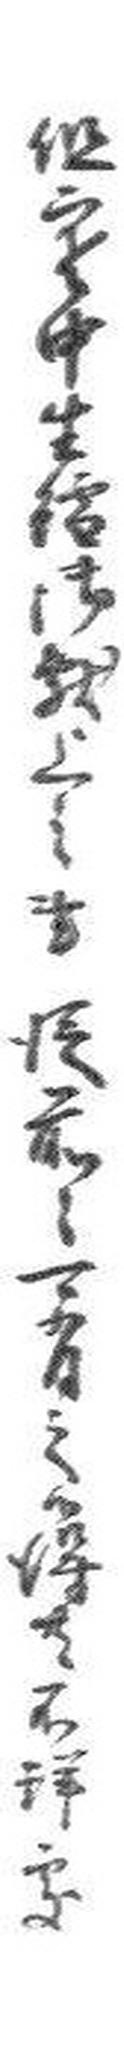但寒中生鱈御献上之事従前々可有之候得共不詳処
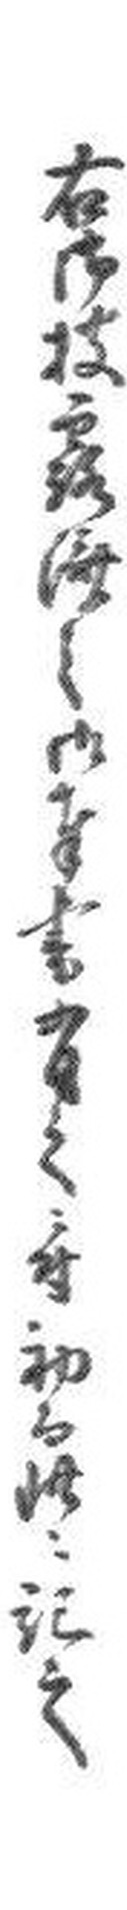右御披露済之御奉書有之ニ付初而此ニ記之

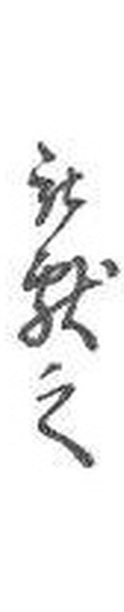被献之
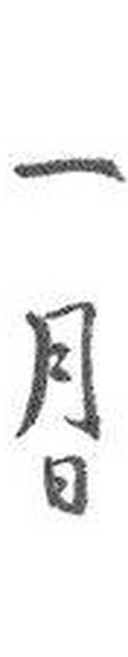一月日
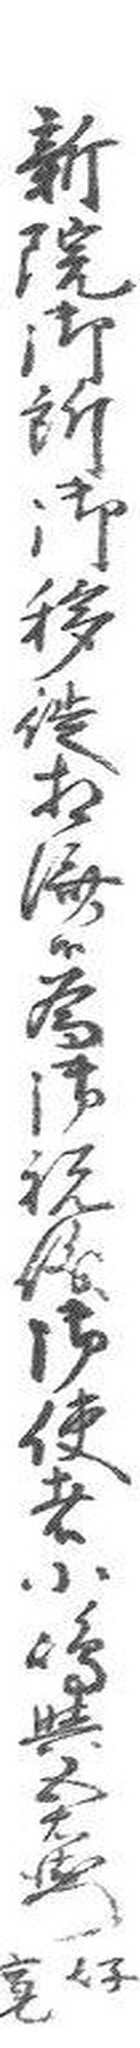新院御所御移徙相済候為御祝儀御使者小島與五右衛門好寛
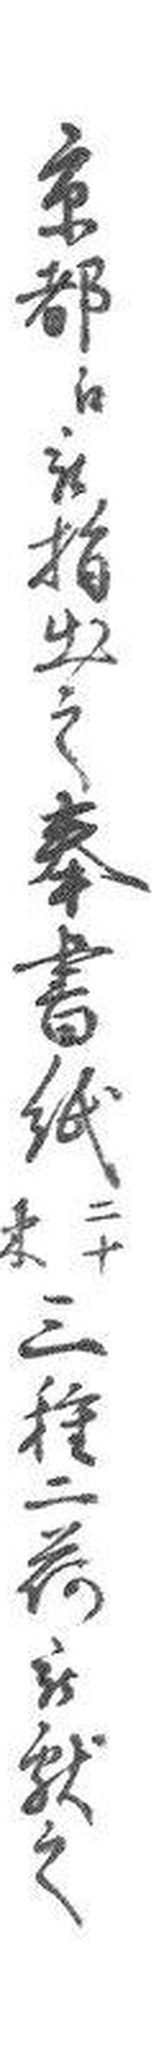京都江被指出之奉書紙二十束三種二荷被献之
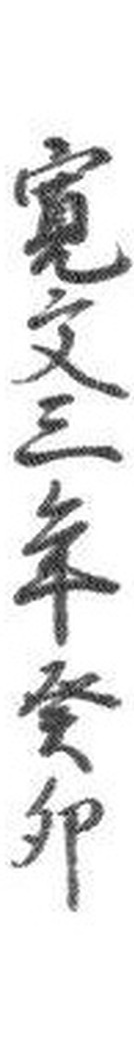寛文三年癸卯
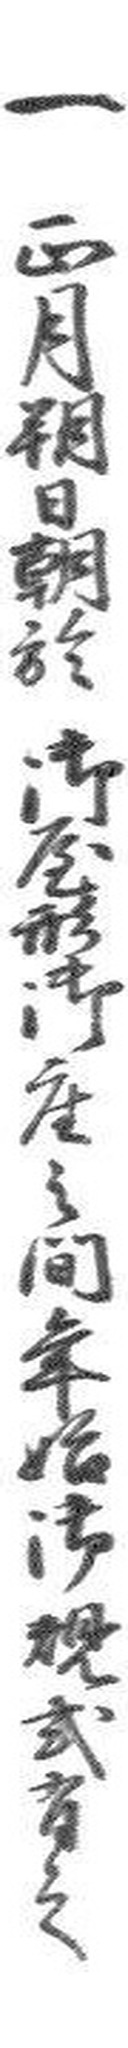一正月朔日朝於御屋形御座之間年始御規式有之
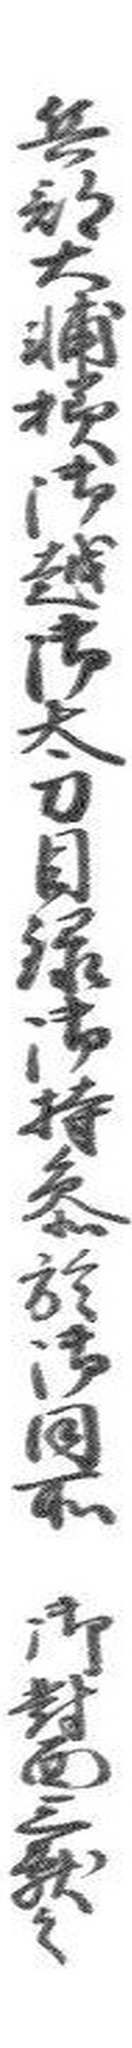兵部大輔様御越御太刀目録御持参於御同所御対面三献之
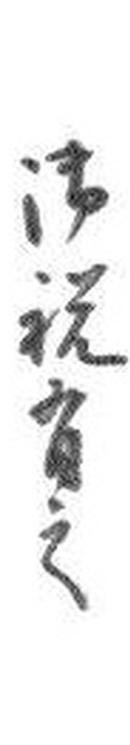御祝有之
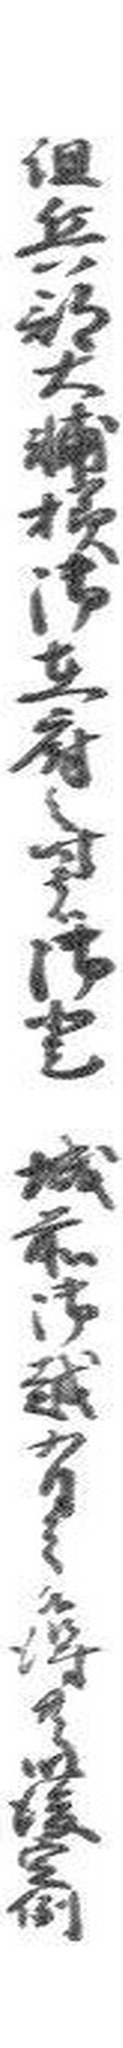但兵部大輔様御在府之時者御登城前御越有之候得共以後定例
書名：家譜 六 光通公 従万治三年到寛文三年
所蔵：福井県文書館 Fukui Prefectural Archives
